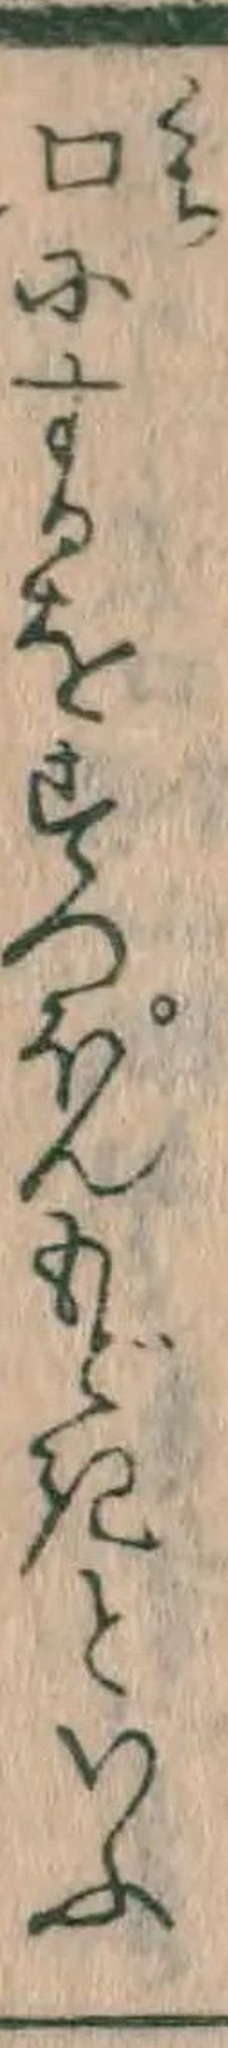口にするをすつぽんもどきといふ
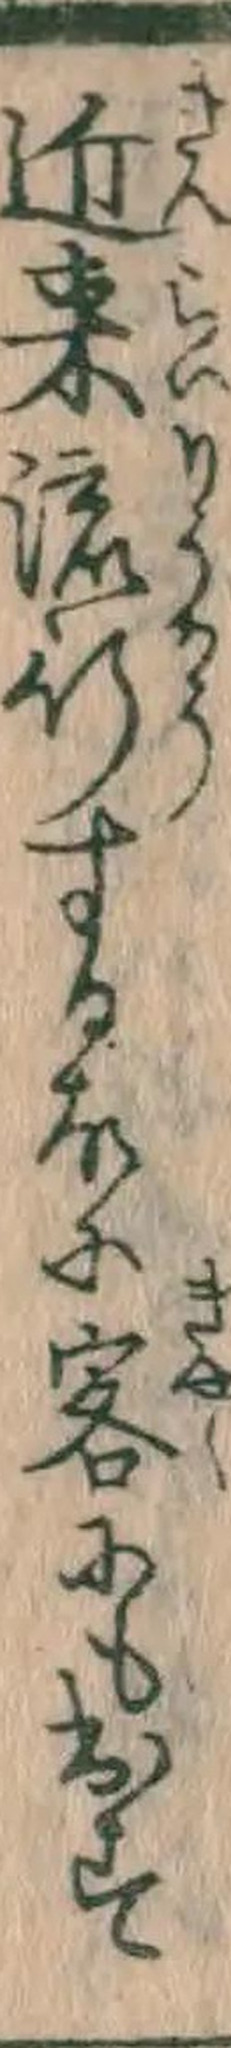近来流行する故に客にも出す
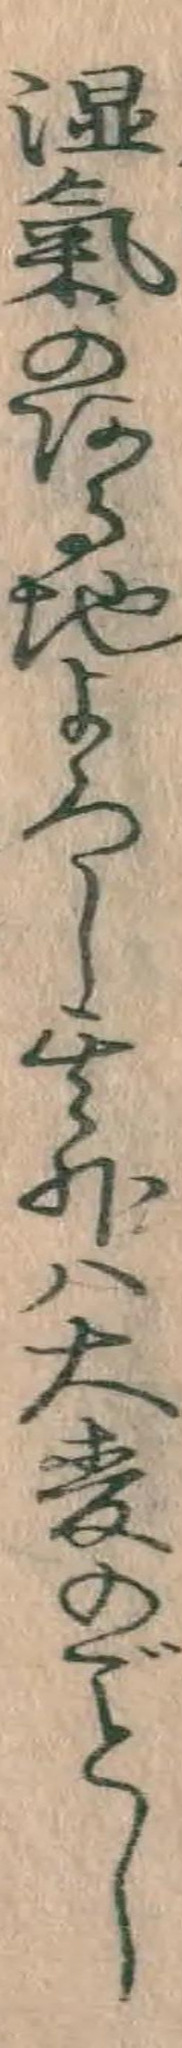湿気のある地よろし其外は大麦のごとし
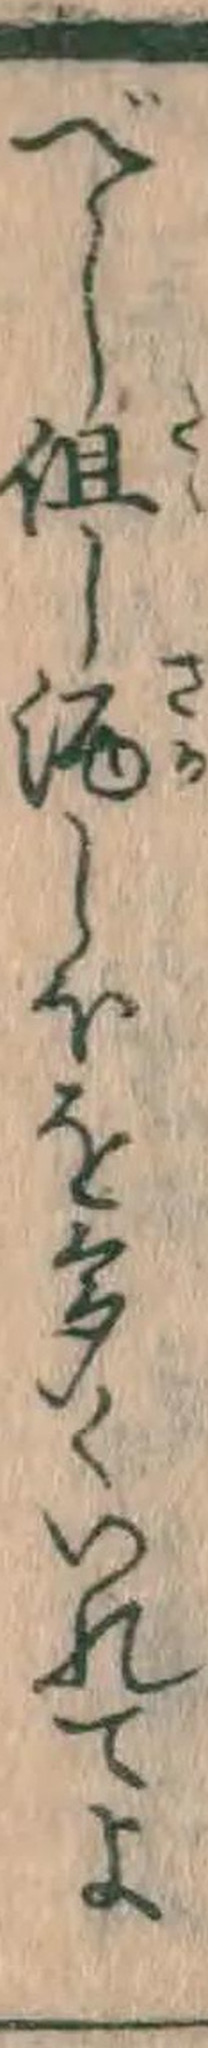べし但し酒しほを多くいれてよ
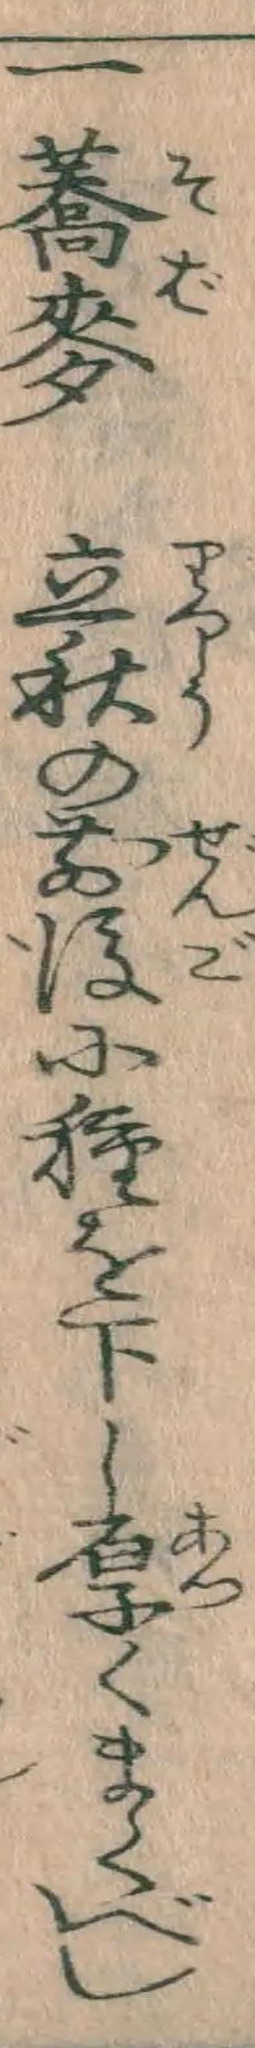一蕎麦立秋の前後に種を下し厚くまくべし
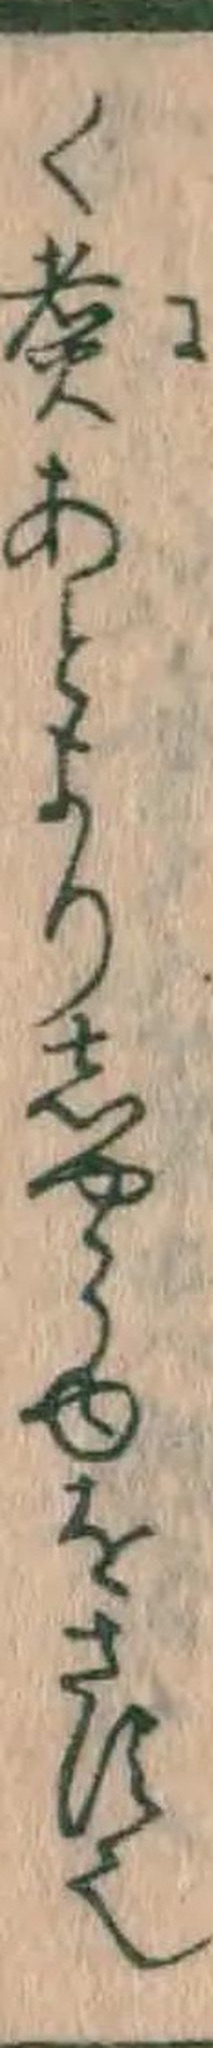く煮あとよりしやうゆをさす也
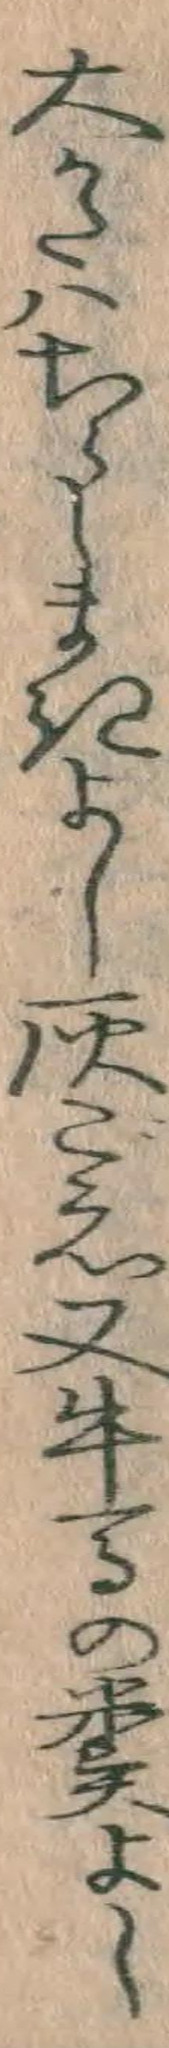大かたはちらしまきよし灰ごえ又牛馬の糞よし
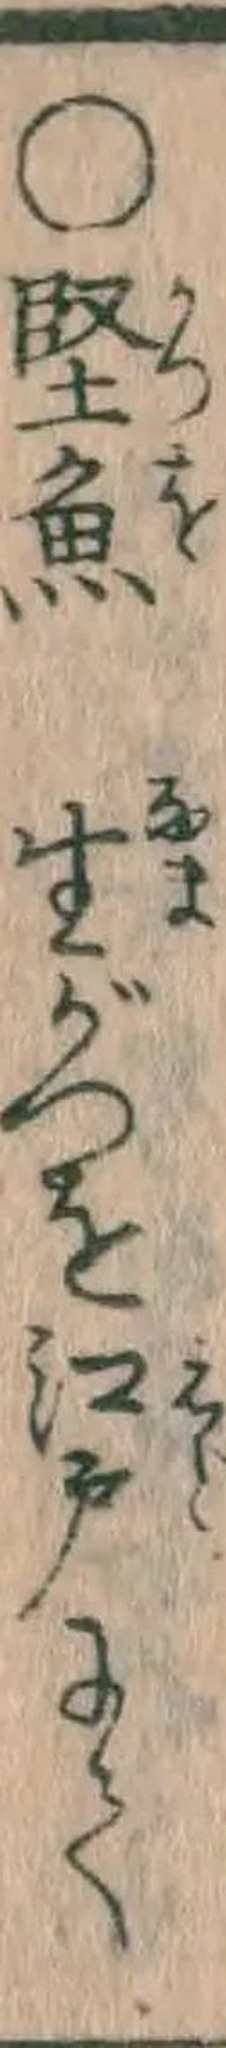○堅魚生がつを江戸にて
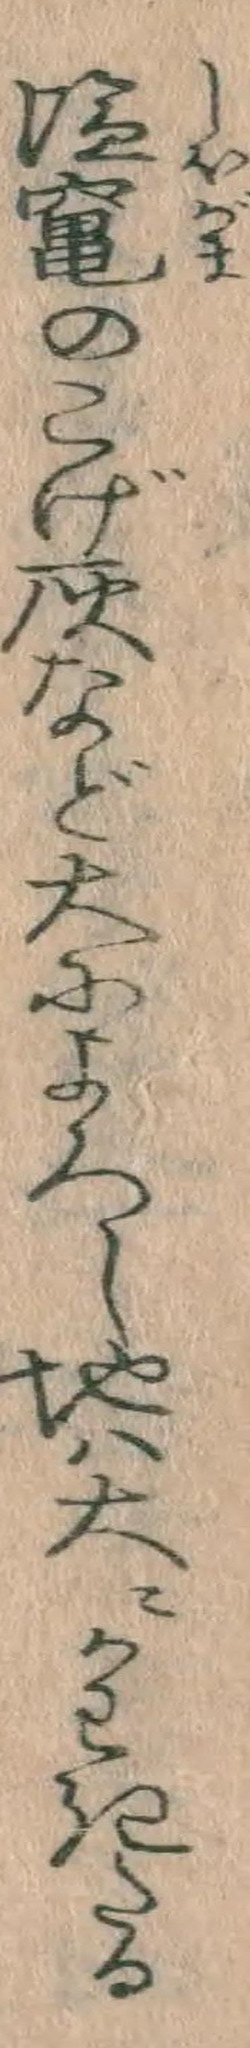塩竈のこげ灰など大によろし地は大にかわきたる
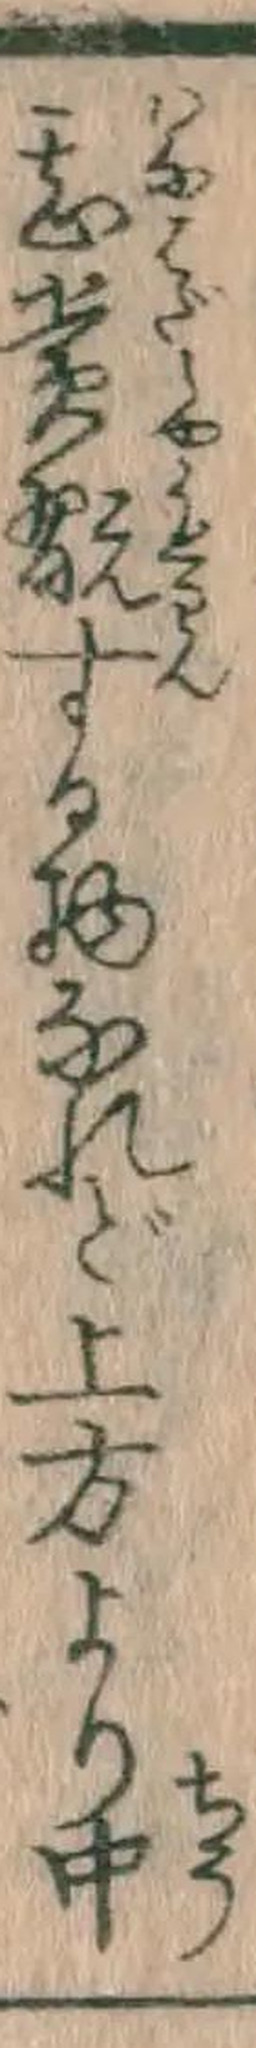甚賞翫する物なれど上方より中
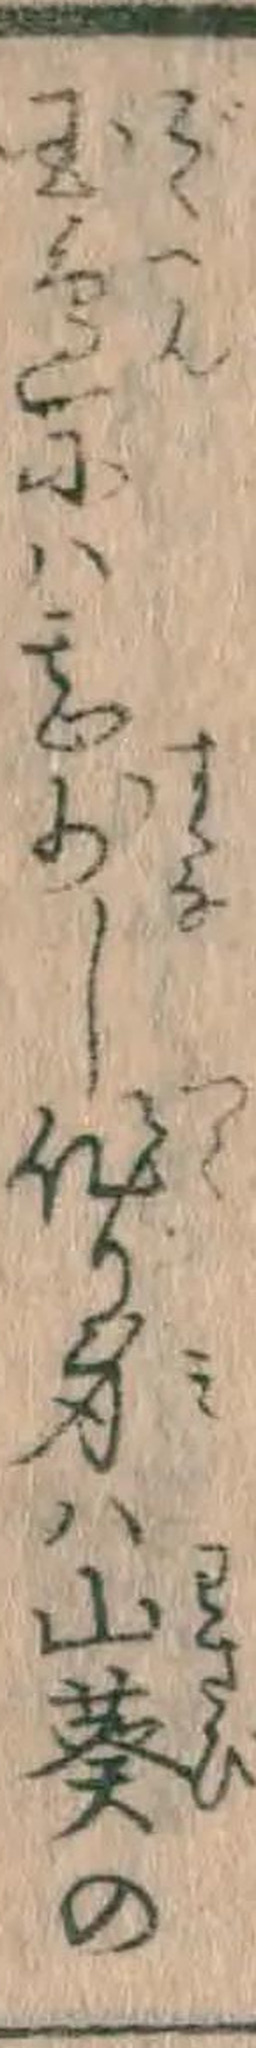国辺には甚少し作り身は山葵の
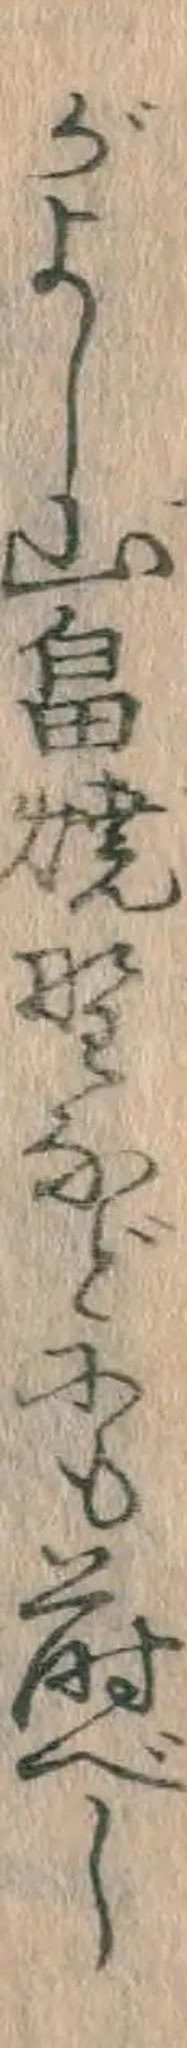がよし山畠焼野などにも蒔べし
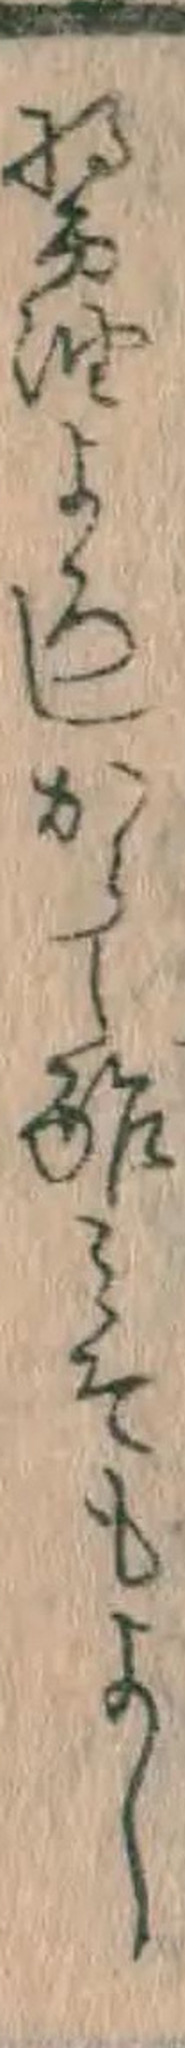醬油よろしからし酢みそもよし
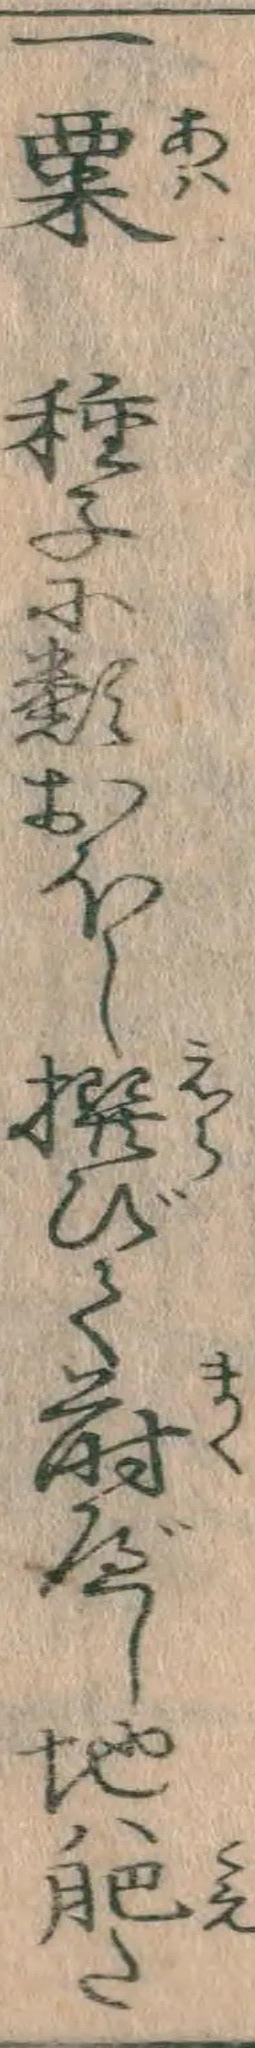一粟種子に類おほし撰びて蒔べし地は肥た
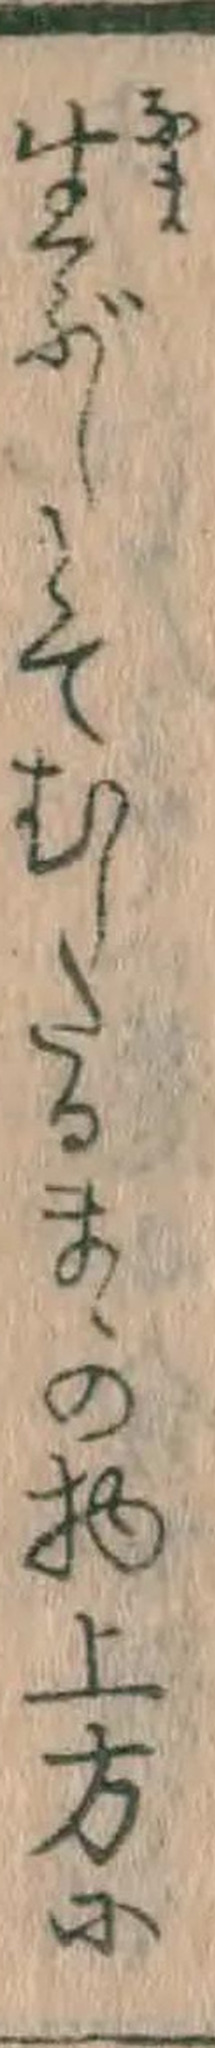生ぶしとてむしたるまゝの物上方に
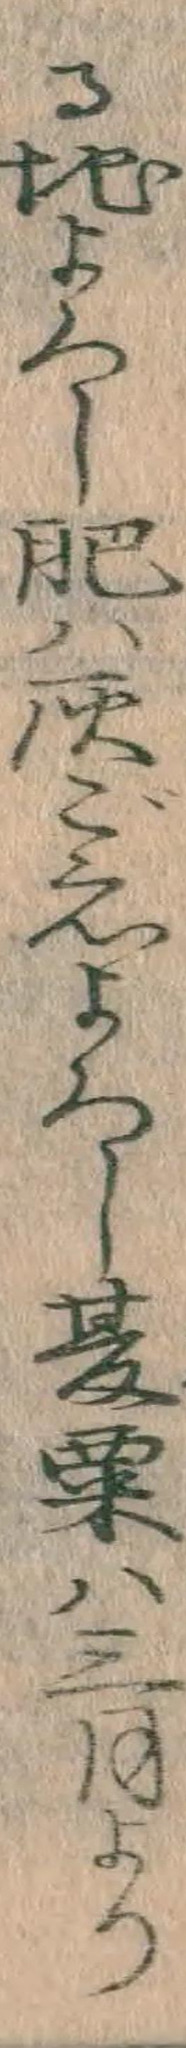る地よろし肥は灰ごえよろし夏粟は三月より
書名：広益秘事大全 3巻. [5]
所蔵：国立国会図書館 National Diet Library, JAPAN
